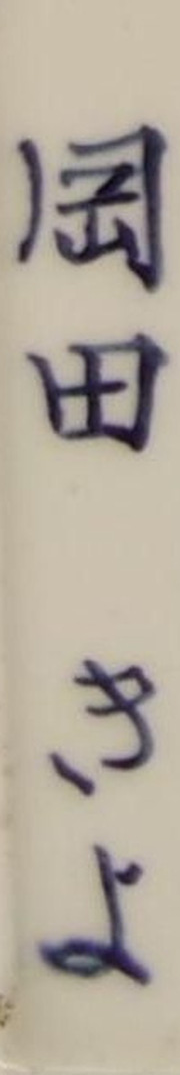岡田きよ

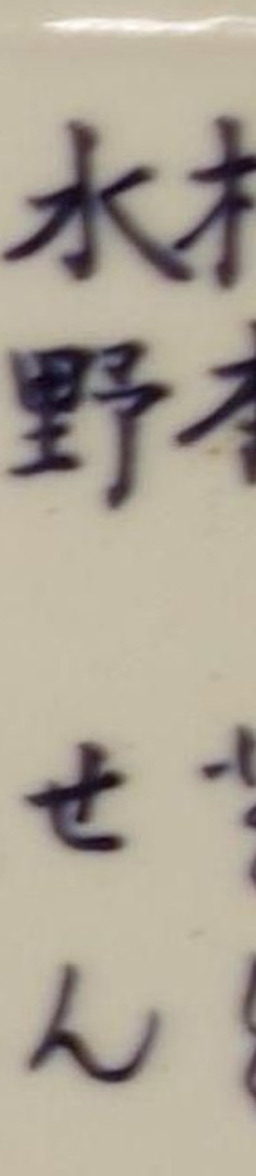水野せん
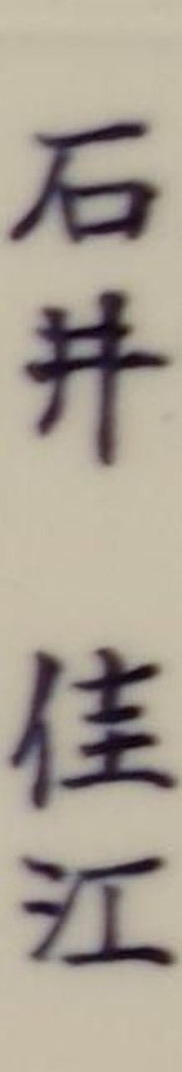石井佳江
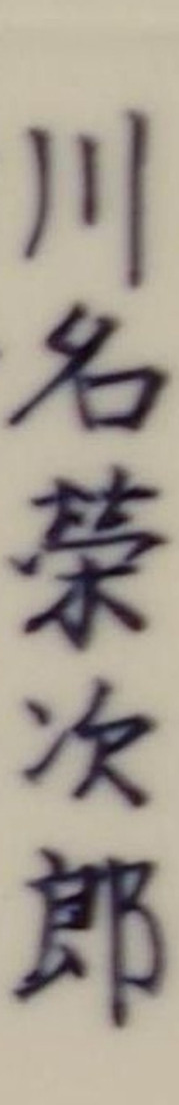川名栄次郎
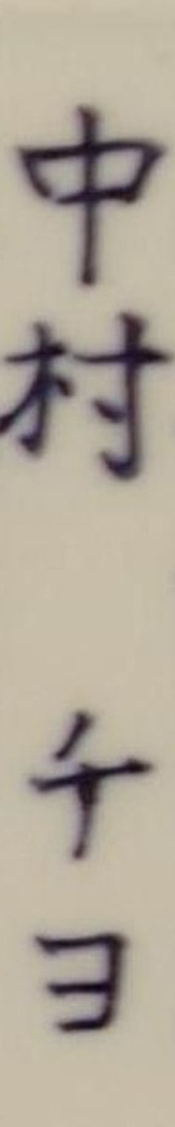中村チヨ
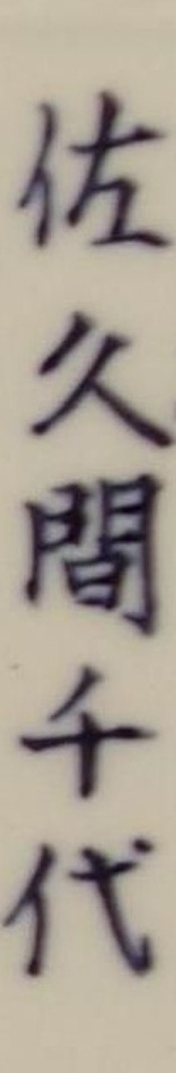佐久間千代
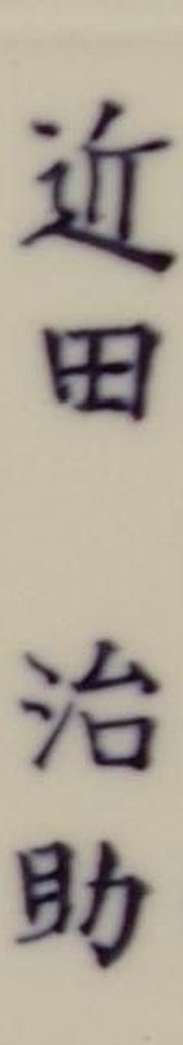近田治助
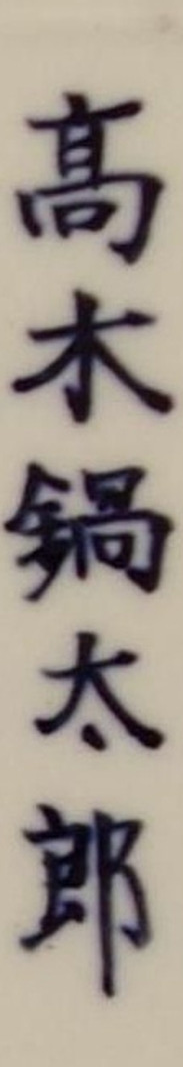高木鍋太郎
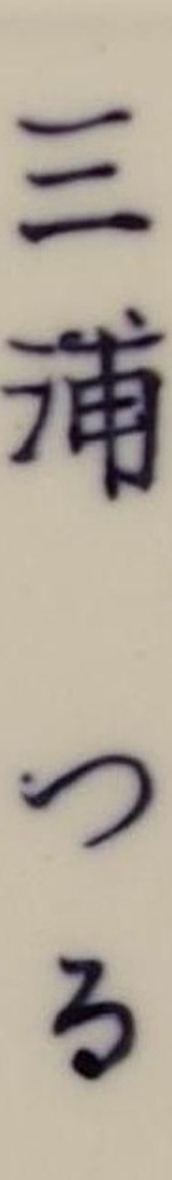三浦つる
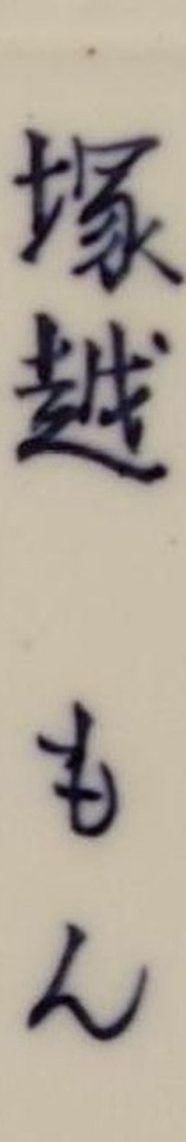塚越もん
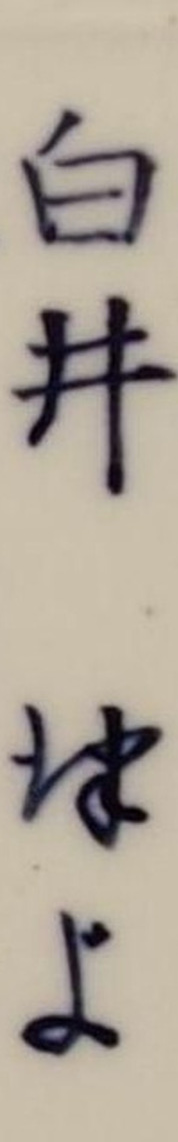白井つよ
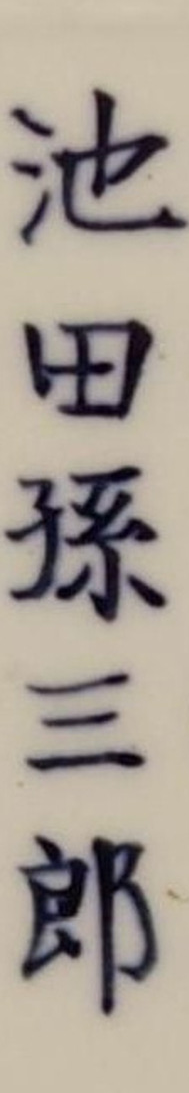池田孫三郎
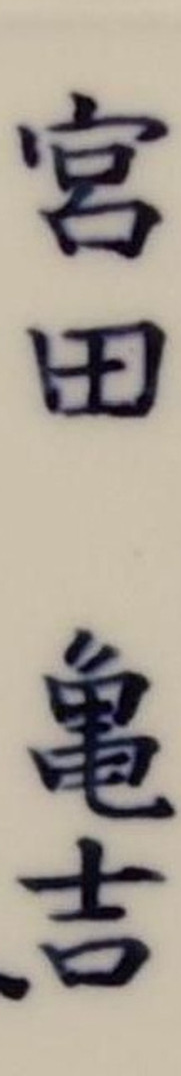宮田亀吉
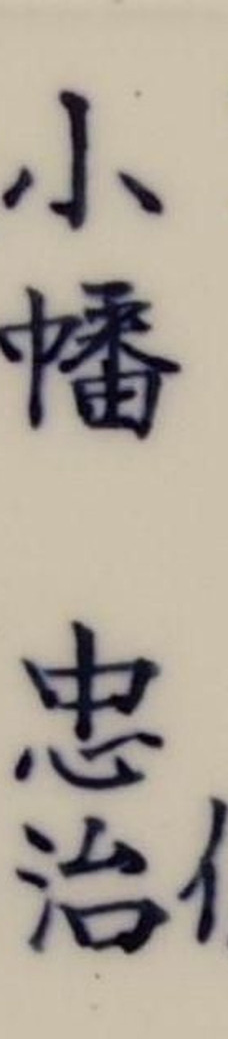小幡忠治
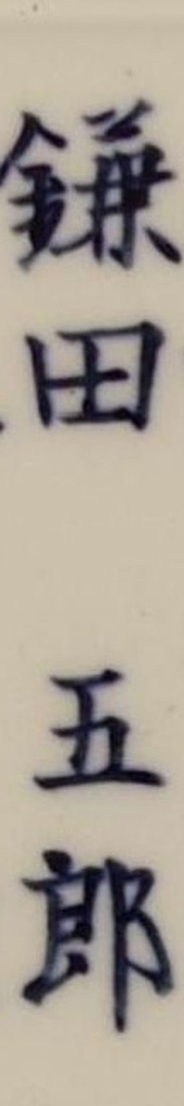鎌田五郎
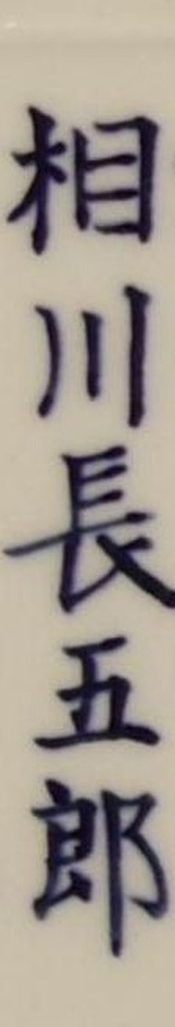相川長五郎
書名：E~L
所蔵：高野山金剛峯寺
